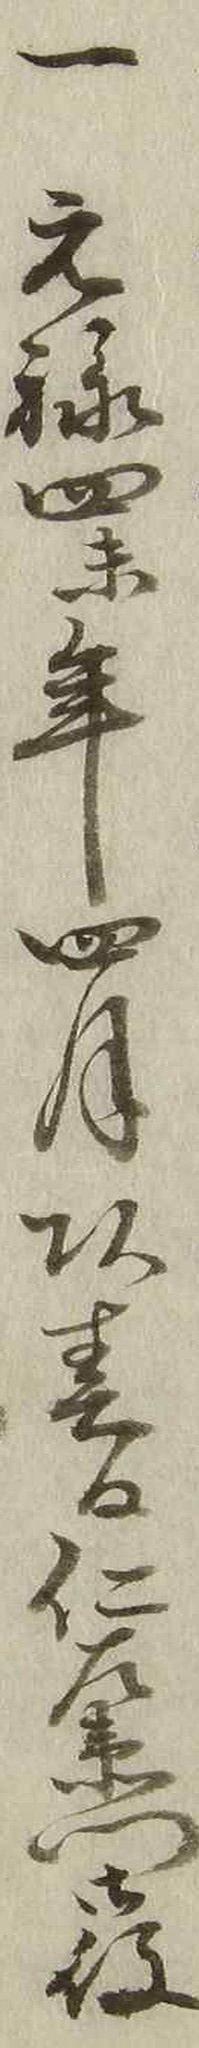一元禄四未年四月頭春日仁左衛門御役
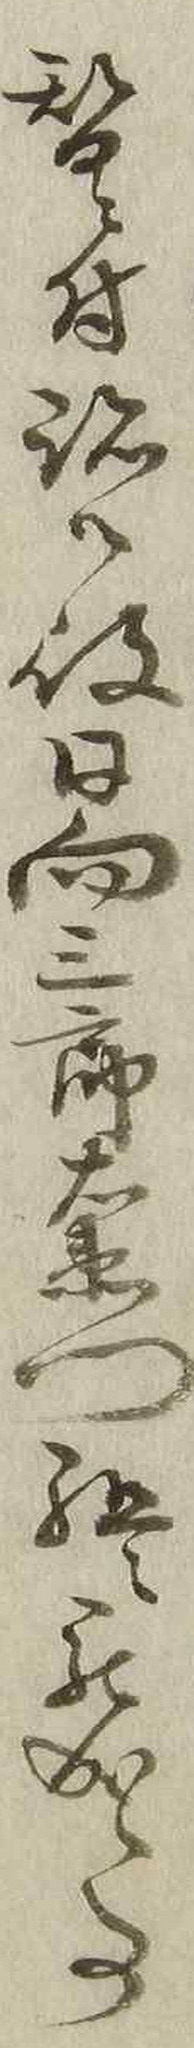替ニ付跡御役日向三郎右衛門組ニ罷成候事
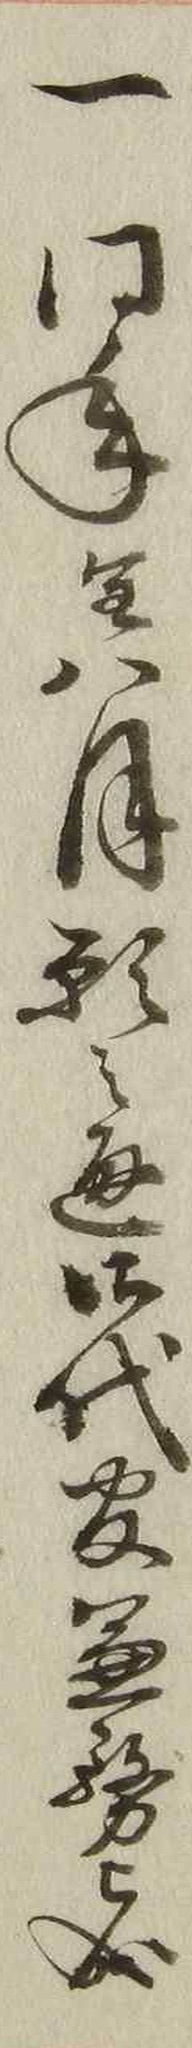一同年閏八月願之通御代官兼務被成
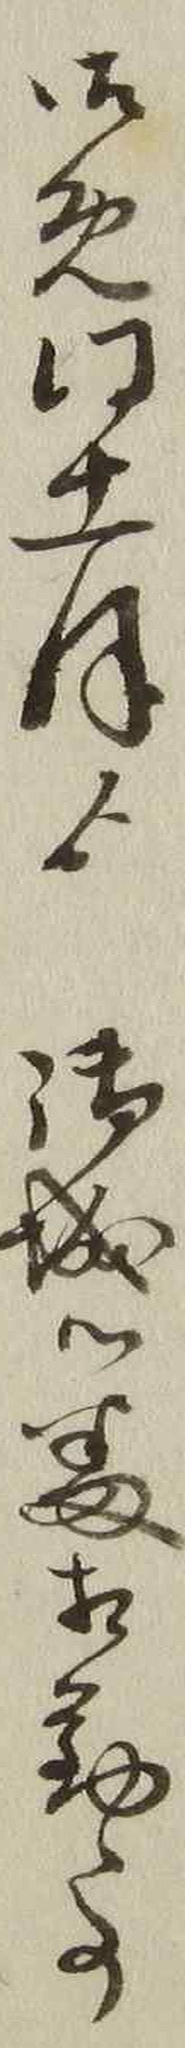御免同十一月ゟ御城御番相勤候事
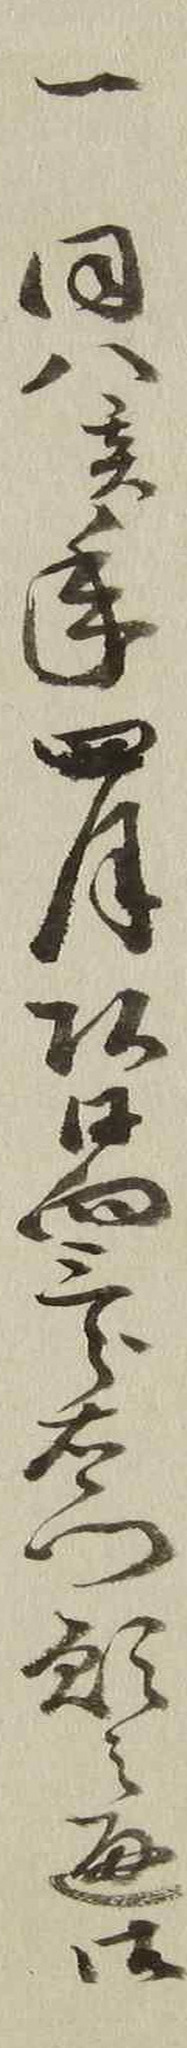一同八亥年四月頭日向三郎右衛門願之通御
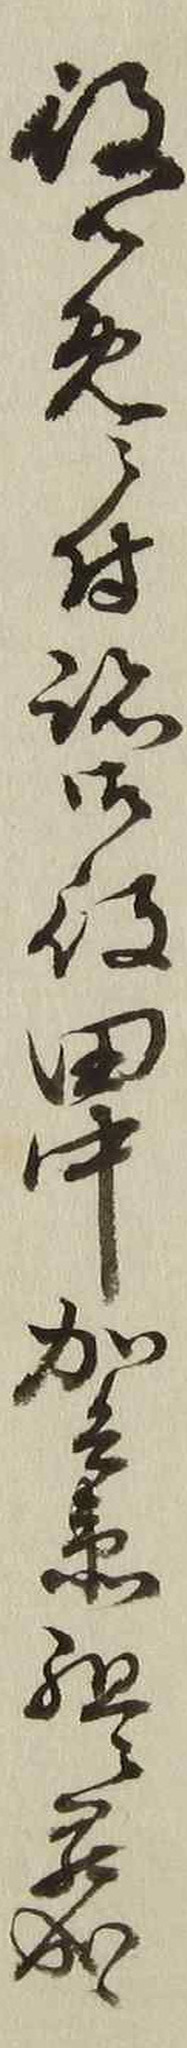役御免ニ付跡御役田中加兵衛組ニ罷成候
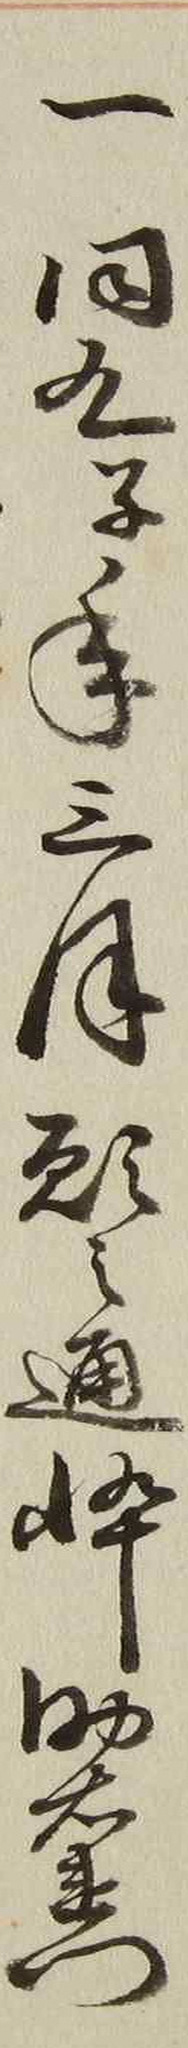一同九子年三月願之通忰助右衛門
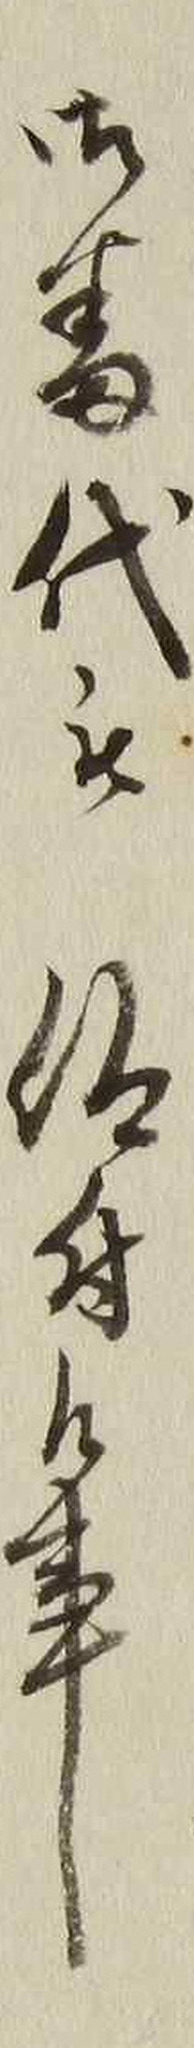御番代被仰付候事
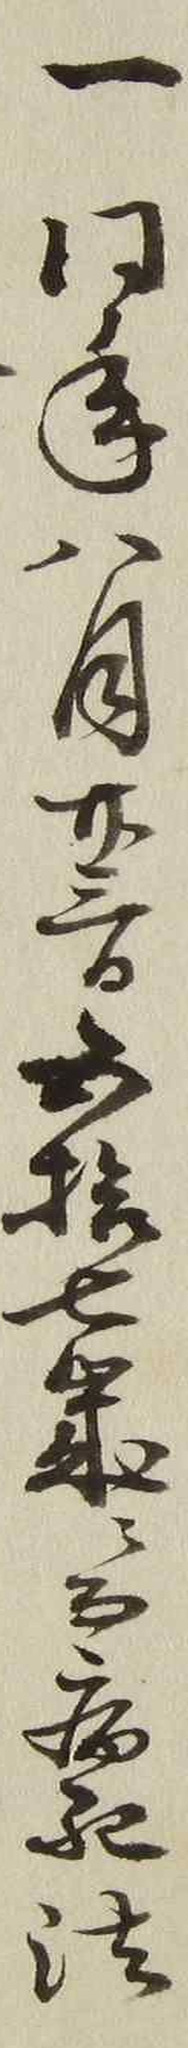一同年八月廿三日五拾七歳ニ而病死法
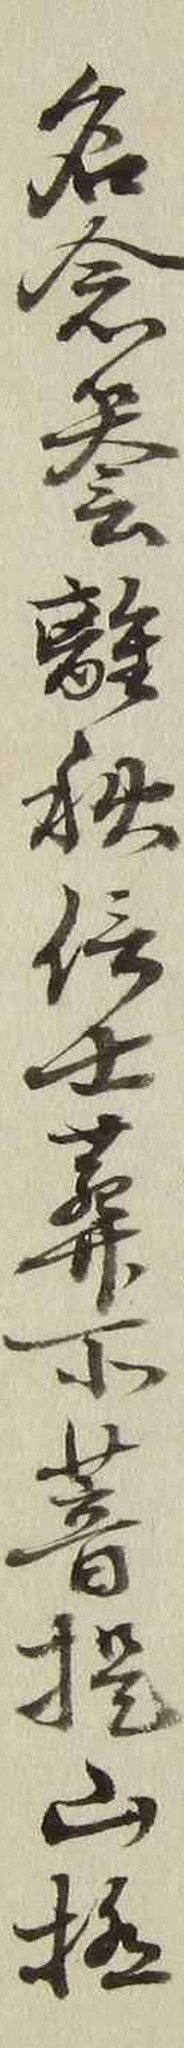名念誉離秋信士葬所菩提山極
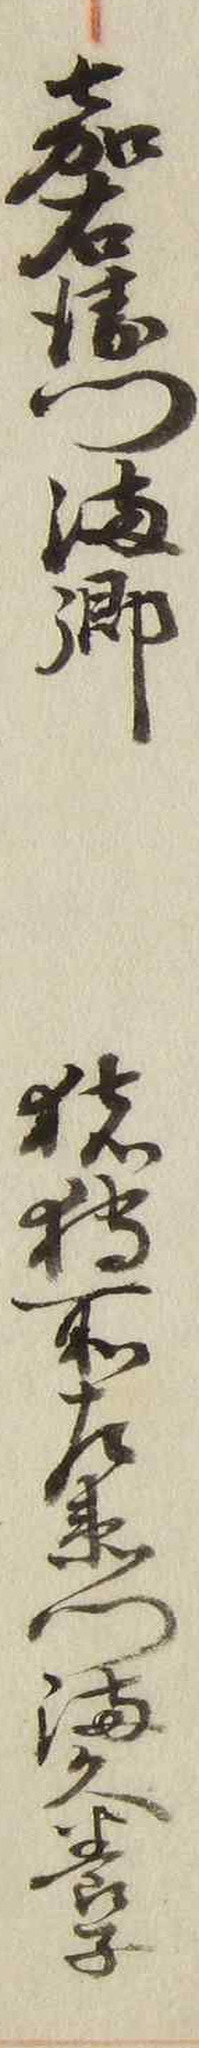嘉右衛門満卿猪狩所左衛門満久養子

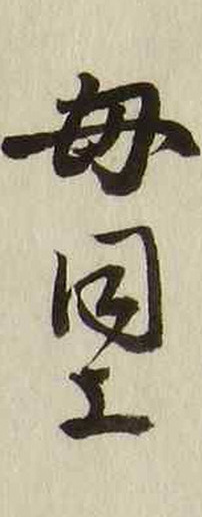母同上
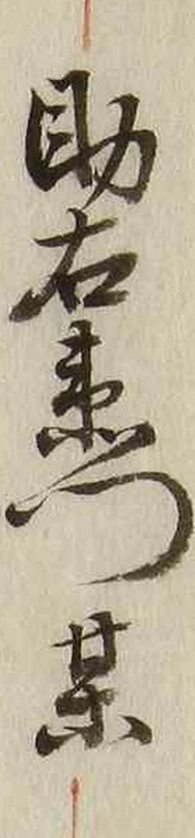助右衛門某
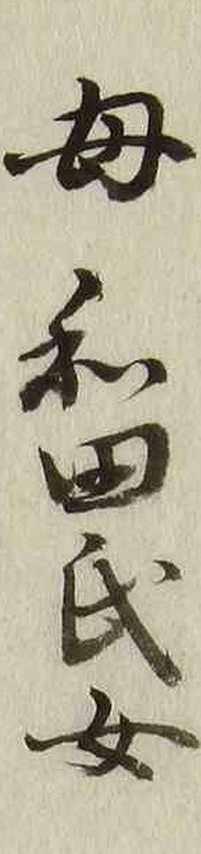母和田氏女
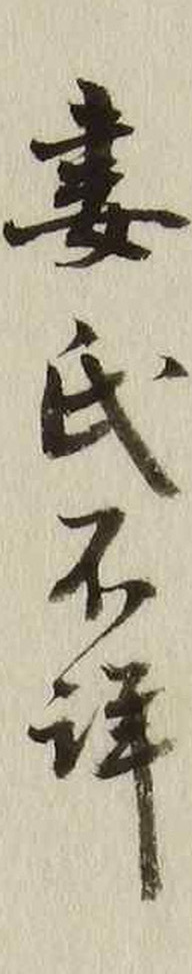妻氏不詳
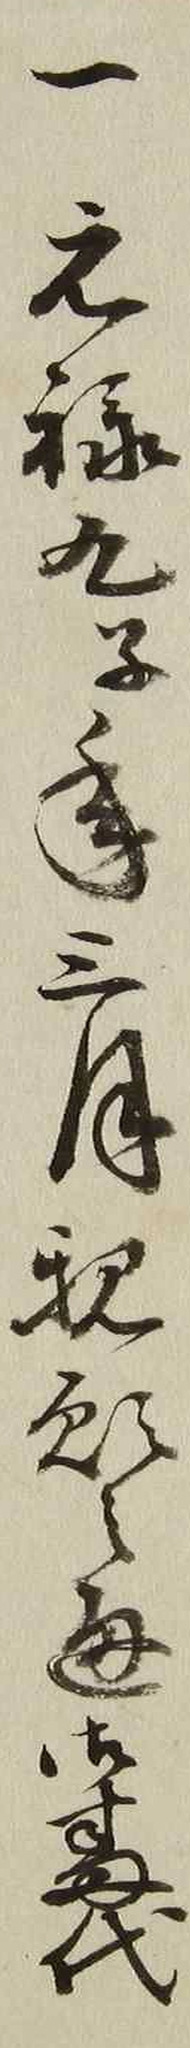一元禄九子年三月親願之通御番代
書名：諸士系譜　巻之27　い之部27
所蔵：会津若松市立会津図書館
